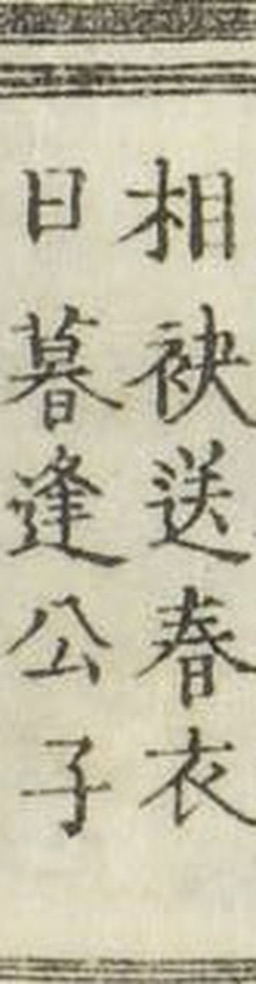日暮逢公子
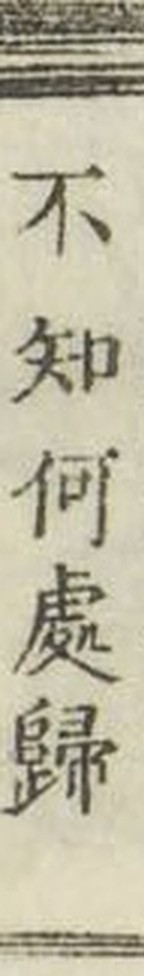不知何処帰

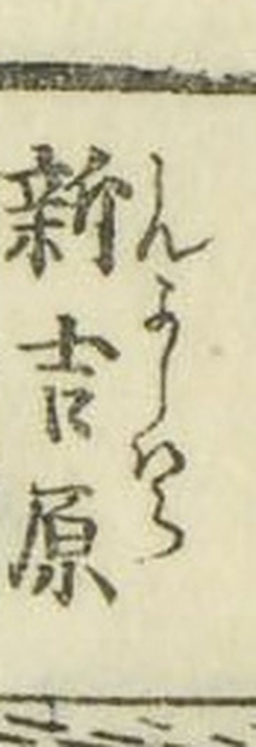新吉原
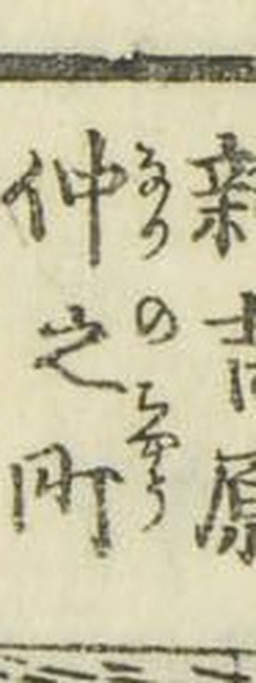仲之町
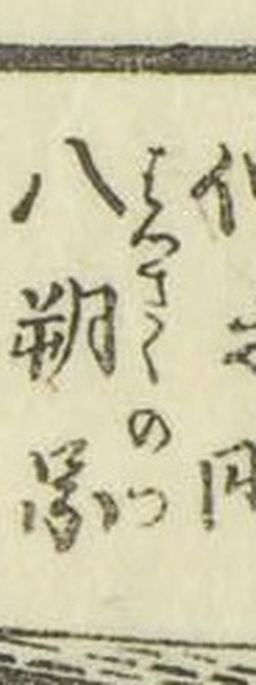八朔図

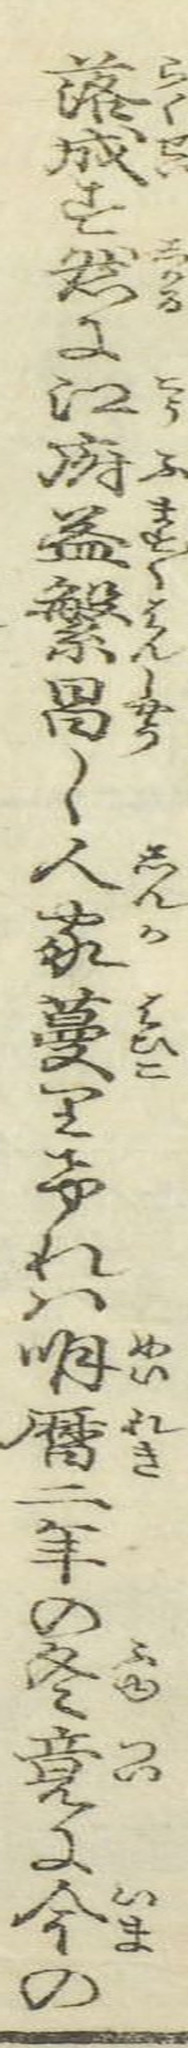落成す然に江府益繁昌し人家蔓りけれは明暦二年の冬竟に今の
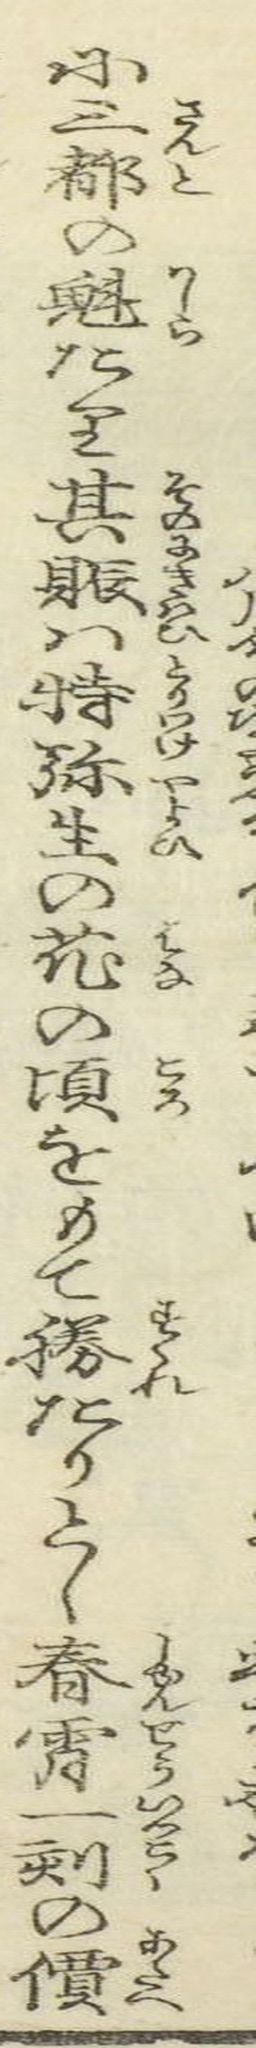に三都の魁たり其賑は特弥生の花の頃をもて勝たりとてし春宵一刻の価
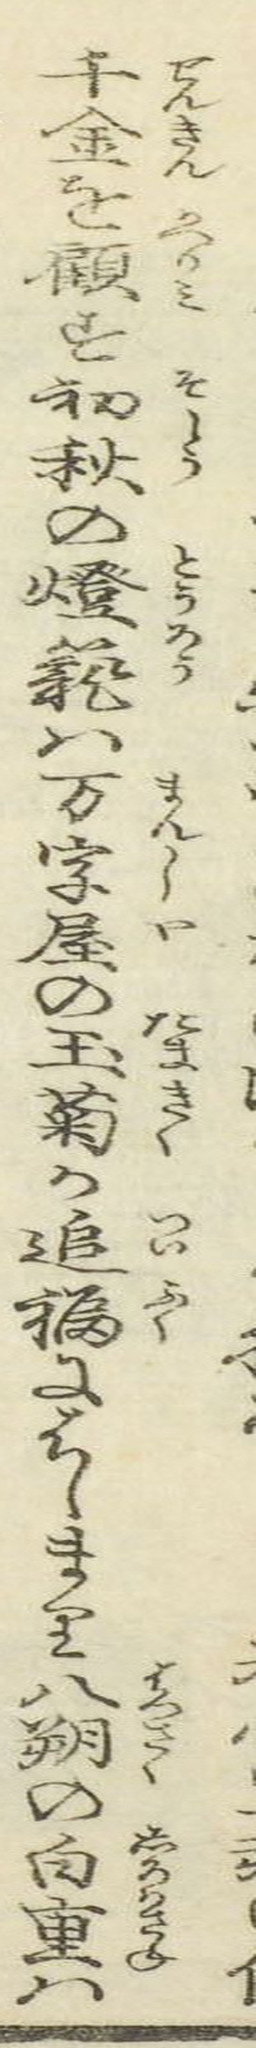千金を顧す初秋灯籠は万字屋の玉菊か追福にはしまり八朔の白重は
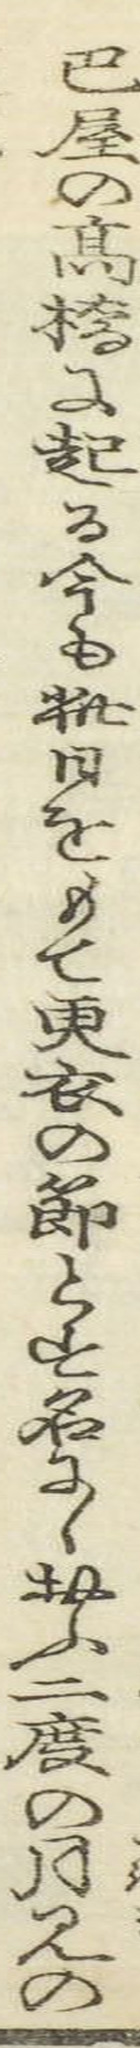巴屋の高橋に起る今も此日をもて更衣の節とす名にしおふ二度の月見の
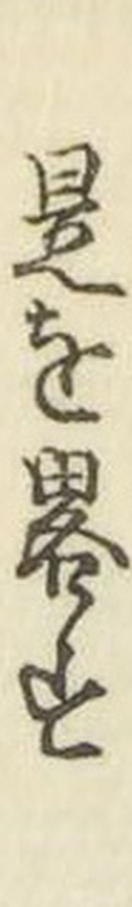是を略す
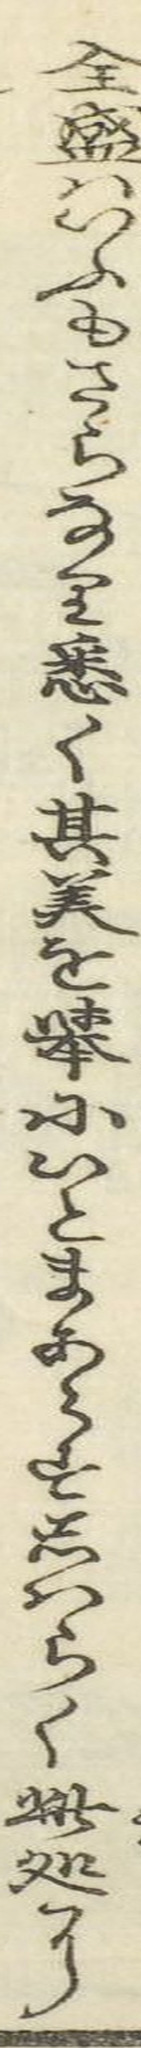全盛はいふもさらなり悉く其美を舉にいとまあらすしはらく此処に
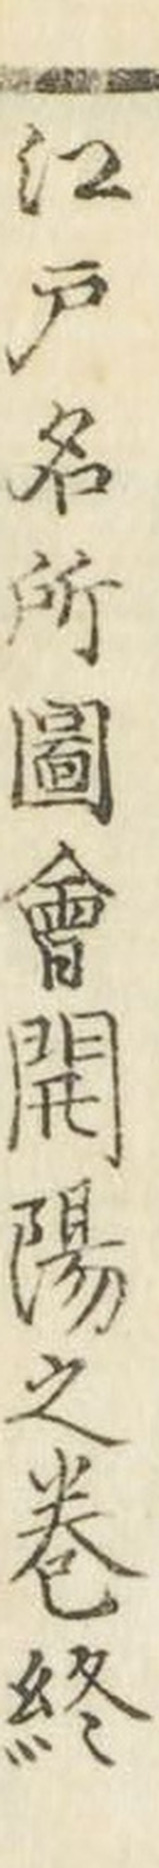江戸名所図会開陽之巻終
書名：江戸名所図会 20巻 巻之17
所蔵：東京学芸大学教育コンテンツアーカイブ
